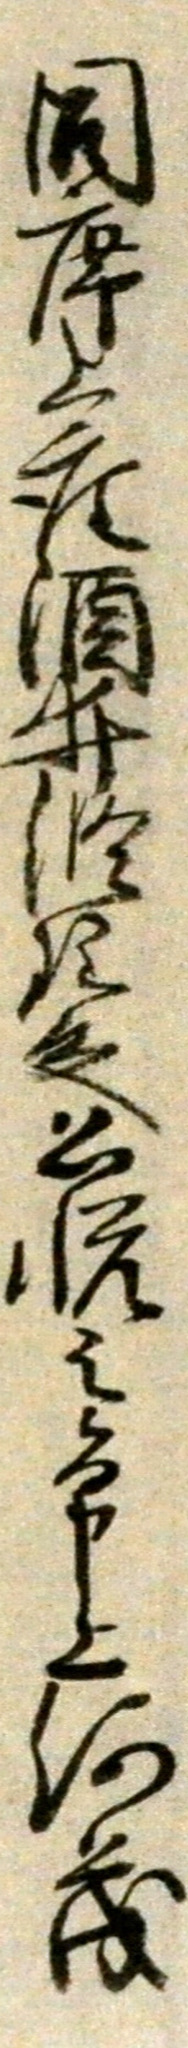同席上座酒井修理殿恐悦之旨申上何も
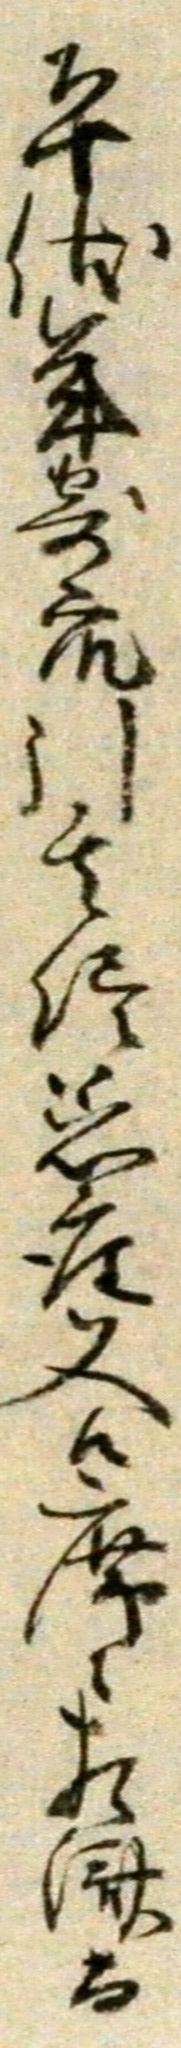平伏年寄衆引其侭着座又候席々相済而
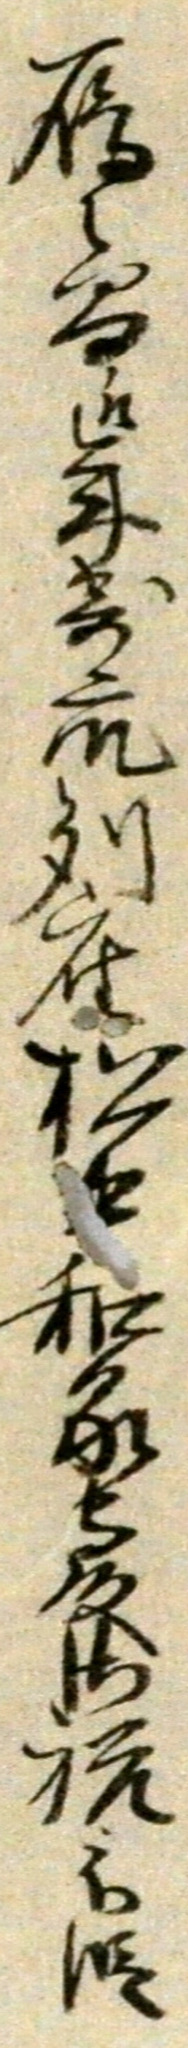雁之間え年寄衆列座松平和泉守殿御祝被下段
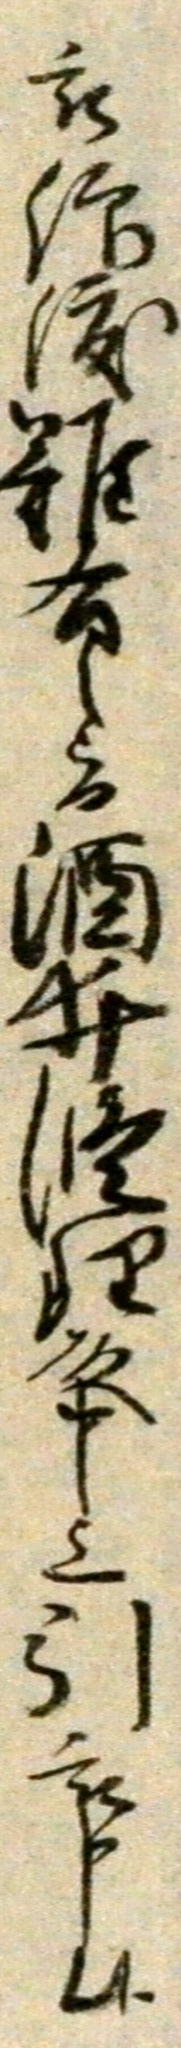被仰渡難有之旨酒井修理殿申上引被申候
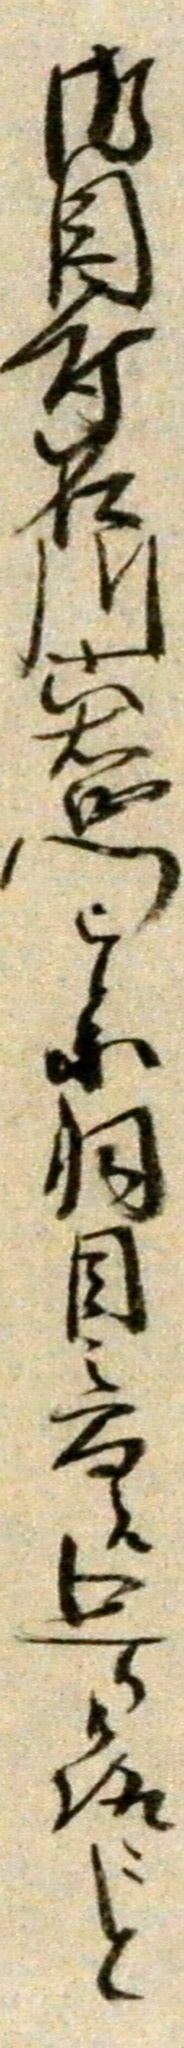御目付石川六右衛門被参羽目之間え廻り候様ニと
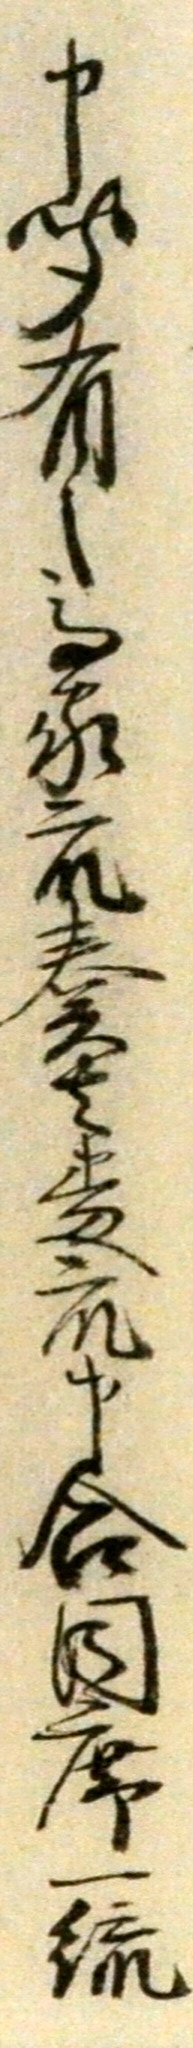申聞有之高家衆奏者番衆申合同席一統
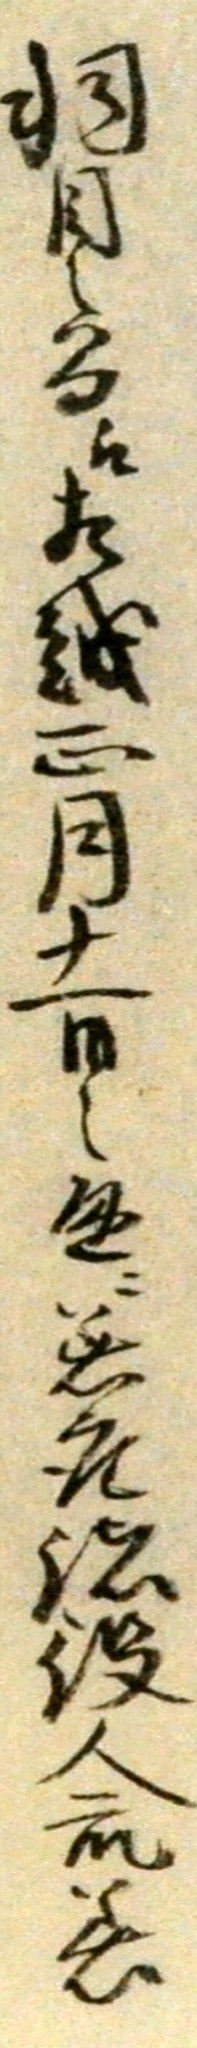羽目之間え相越正月十一日之通ニ着座諸役人衆着
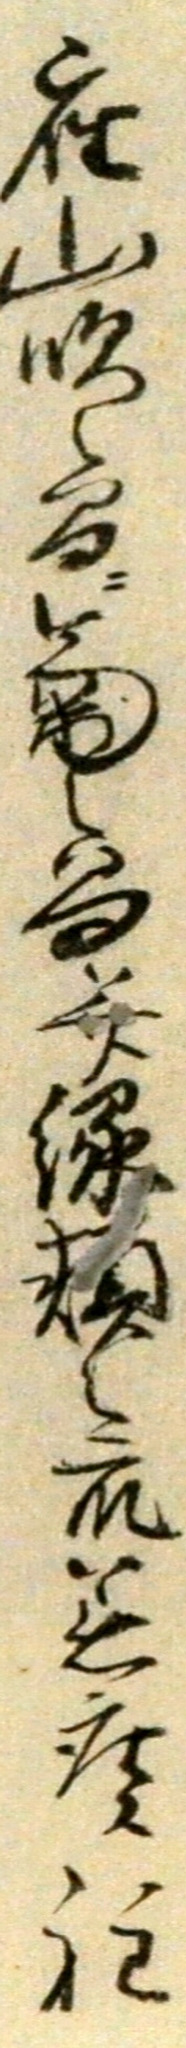座山吹之間ニ菊之間并縁頬之衆着座ス程
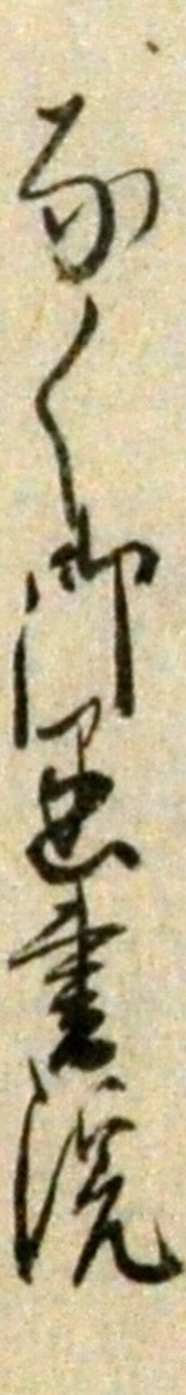なく御黒書院
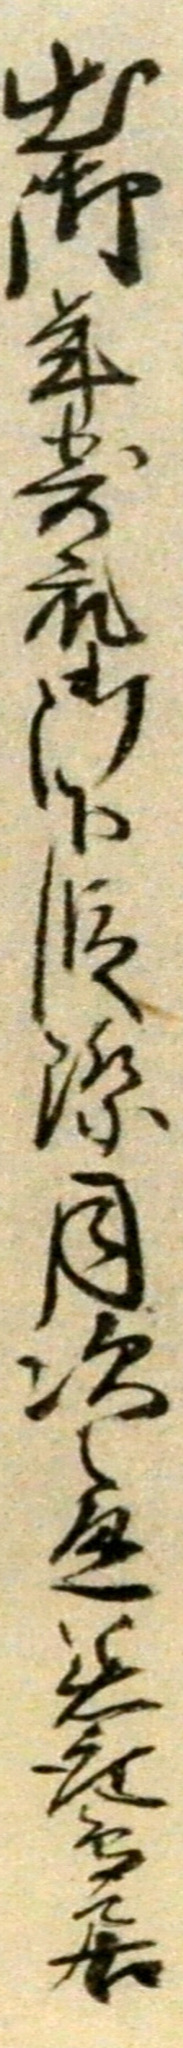出御年寄衆御下段際月次之通着座鳥居

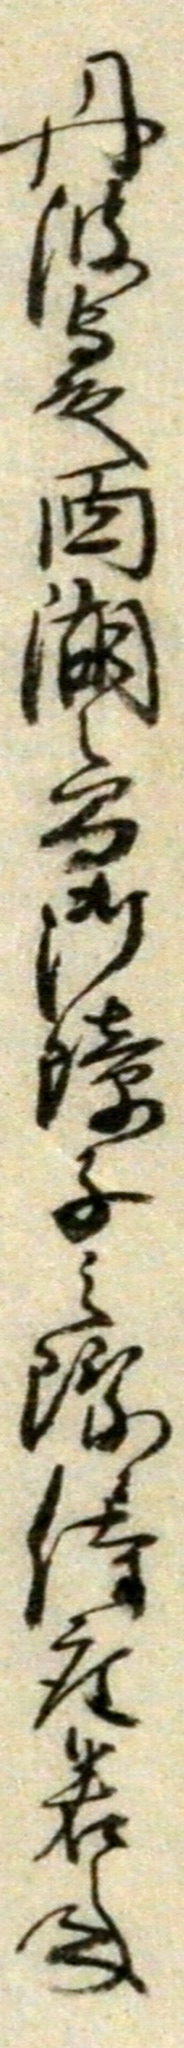丹波守殿西湖之間御障子之際ニ侍座若年
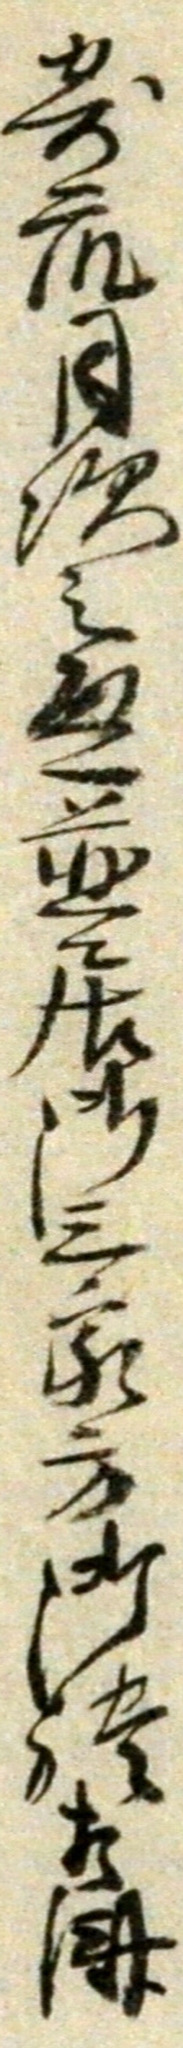寄衆月次之通並居御三家方御禮相済
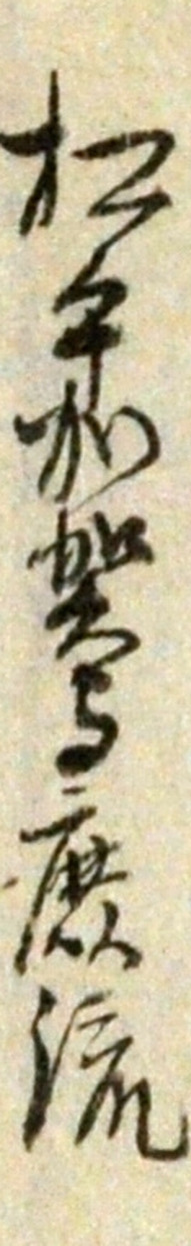松平加賀守庶流
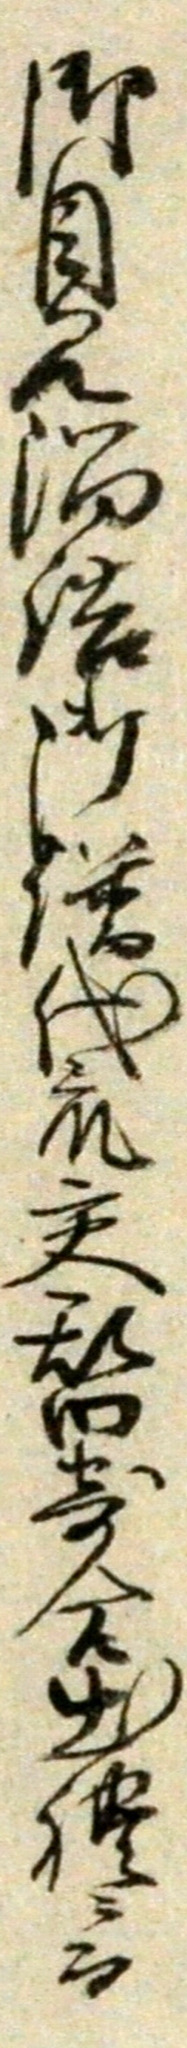御目見溜詰御譜代衆交替寄合出禮ニ而
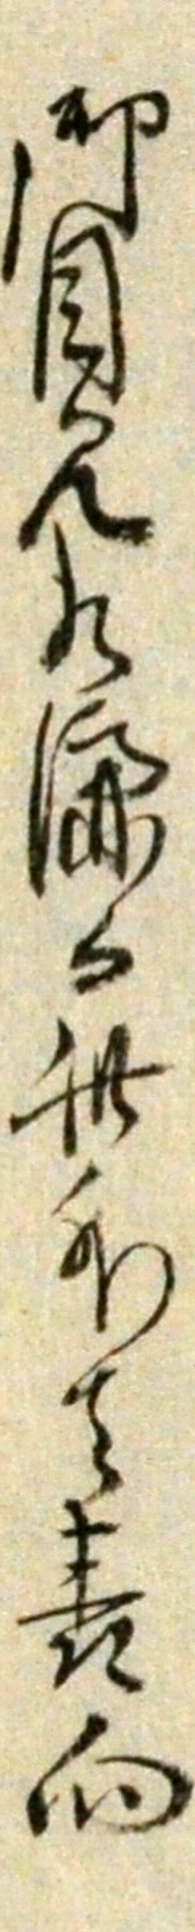御目見相済而此外は表向
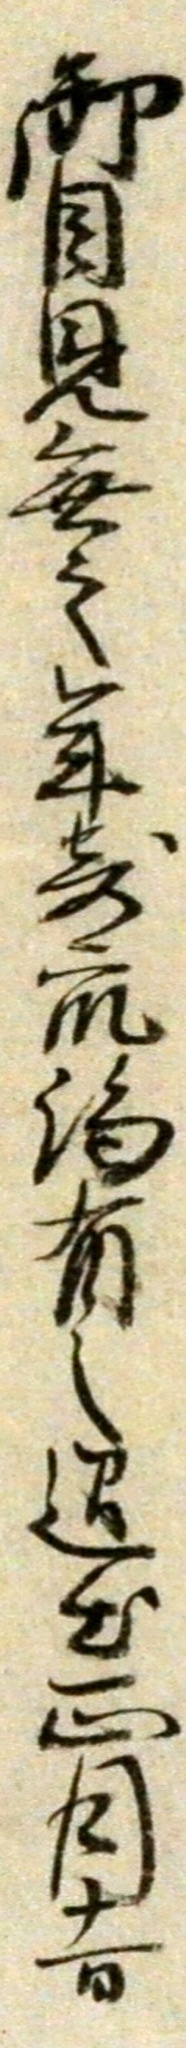御目見無之年寄衆謁有之退出正月十一日
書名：若君様（家斉嫡男）誕生諸祝儀ノ節ノ留書外
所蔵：伊那市立高遠町図書館・合同会社AMANE
